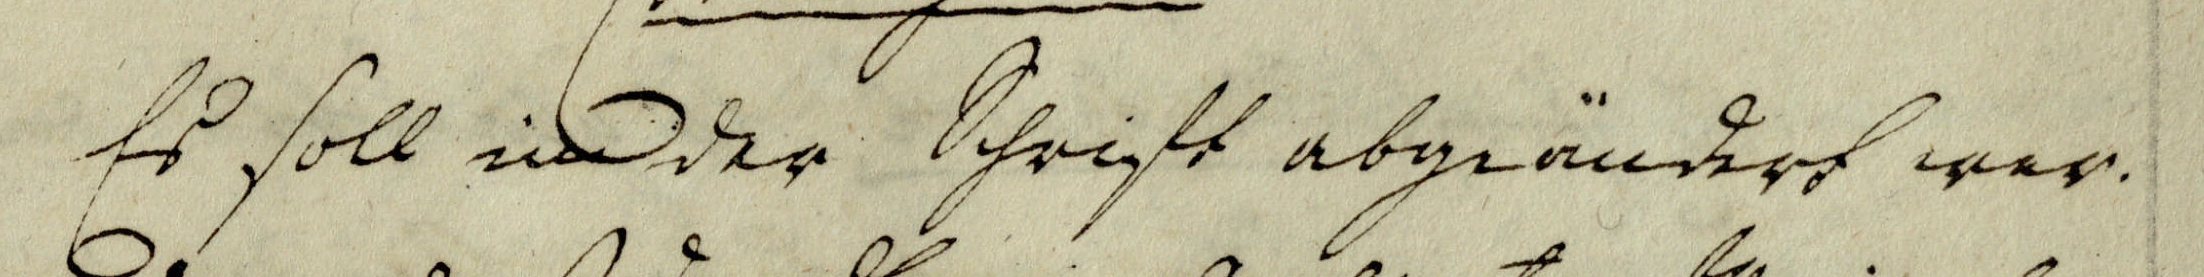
Es soll in der Schrift abgeändert wer¬
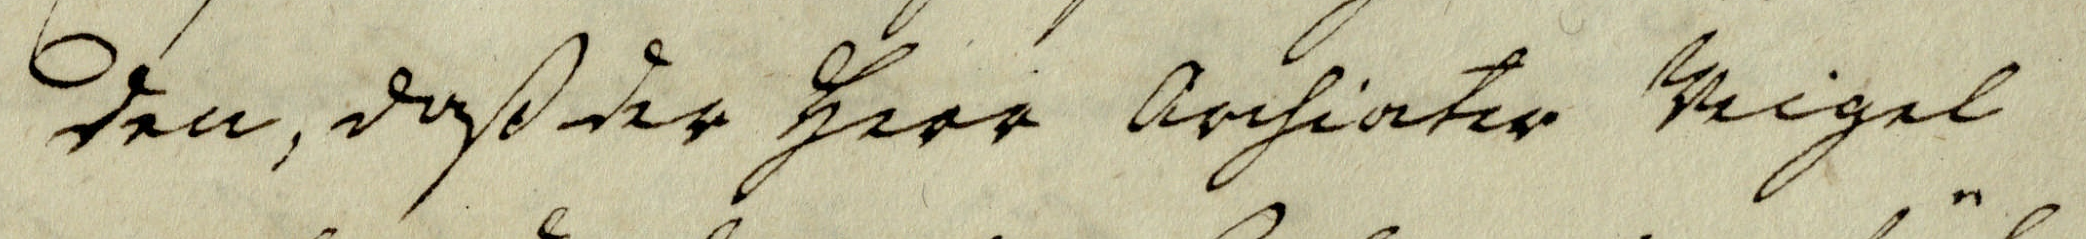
den, daß der Herr Archiater Weigel
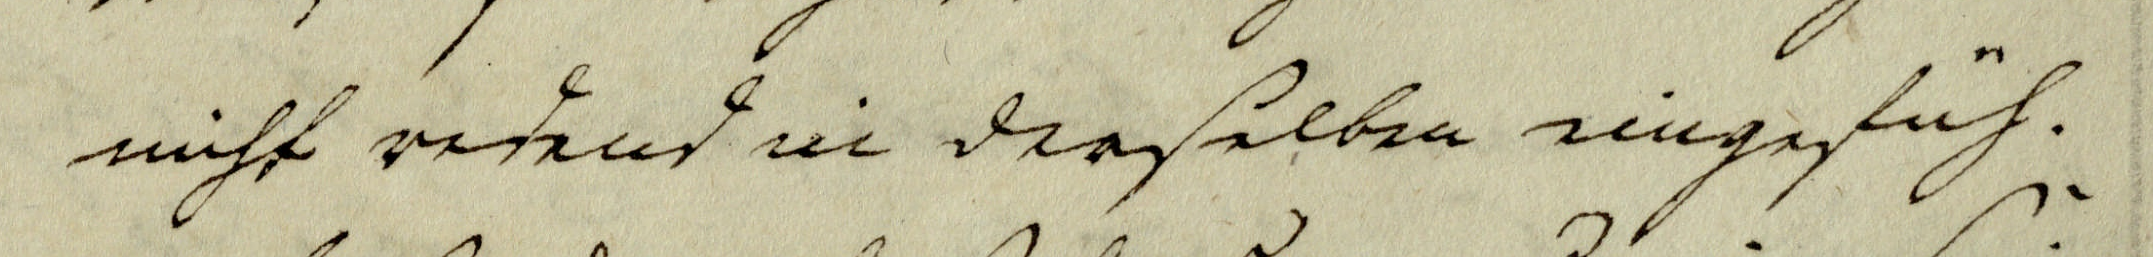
nicht redend in derselben eingefüh¬
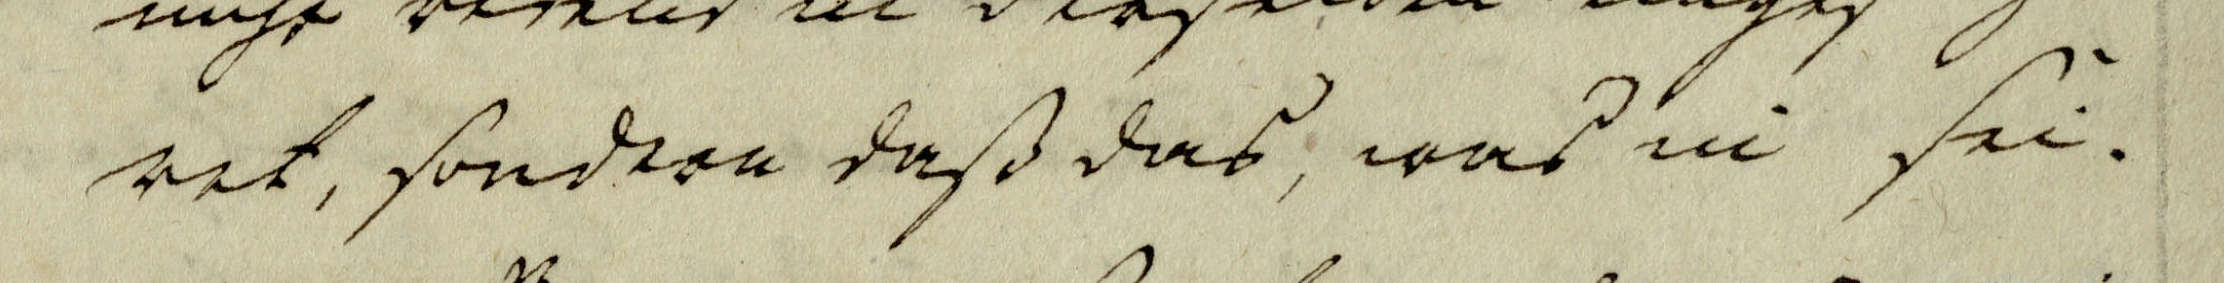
ret, sondern daß das, was in sei¬
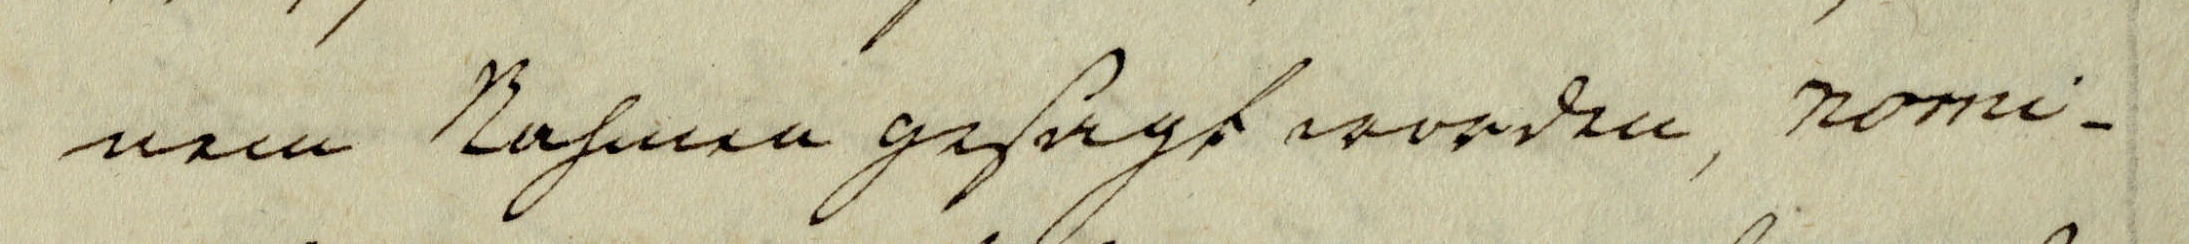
nem Nahmen gesagt worden, nomi¬
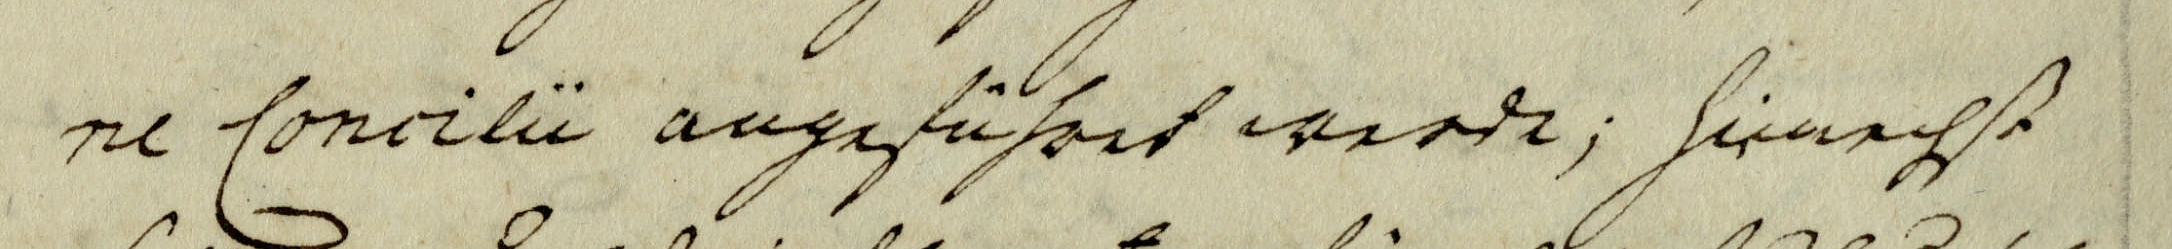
ne Concilii angeführet werde; hienechst
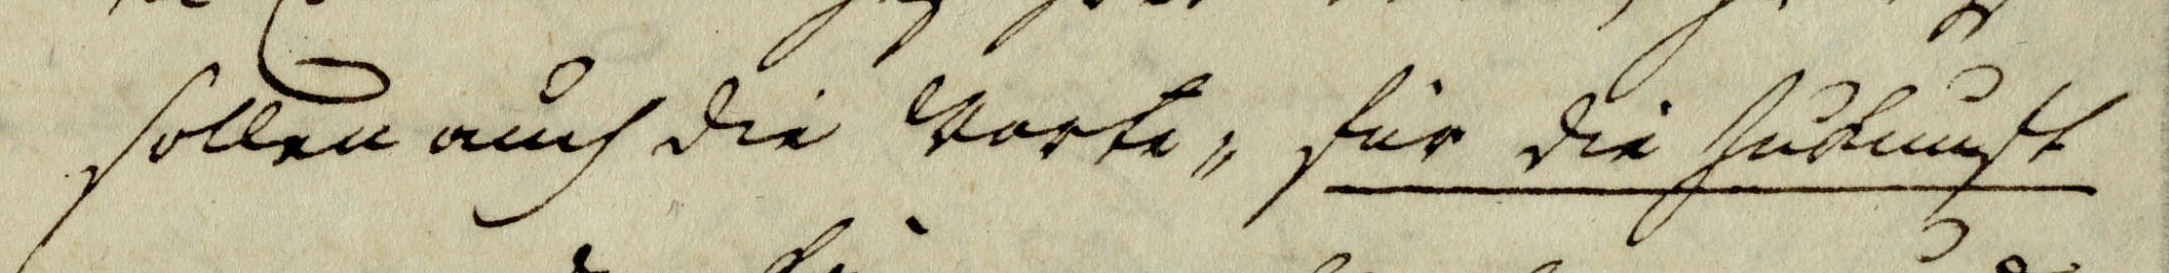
sollen auch die Worte "für die Zukunft
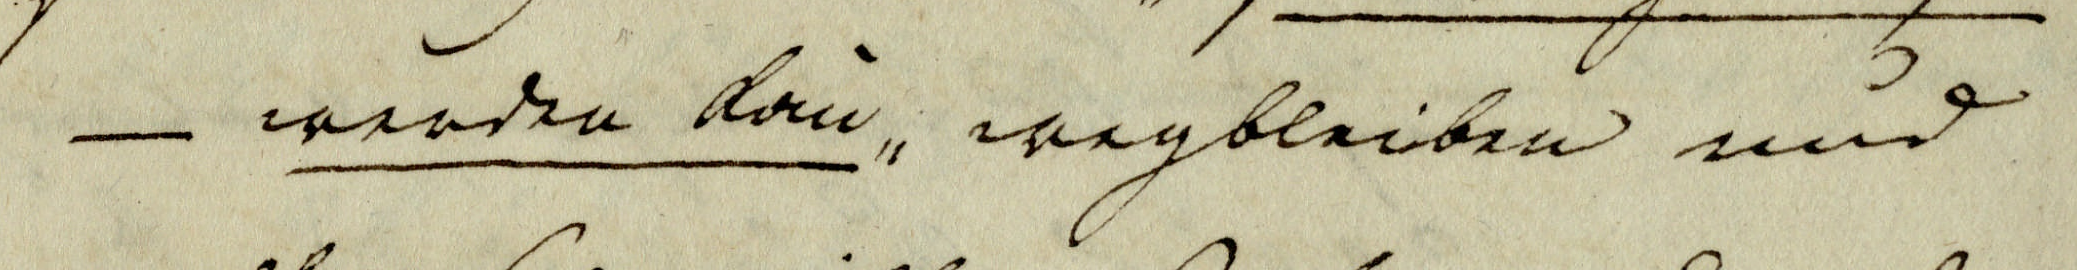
werden kan" wegbleiben und
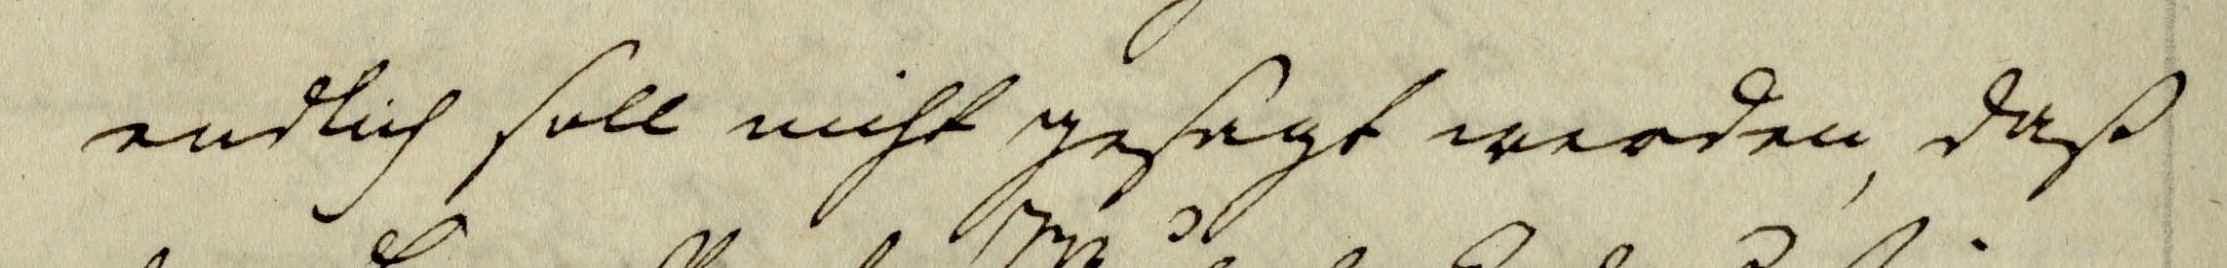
endlich soll nicht gesagt werden, daß
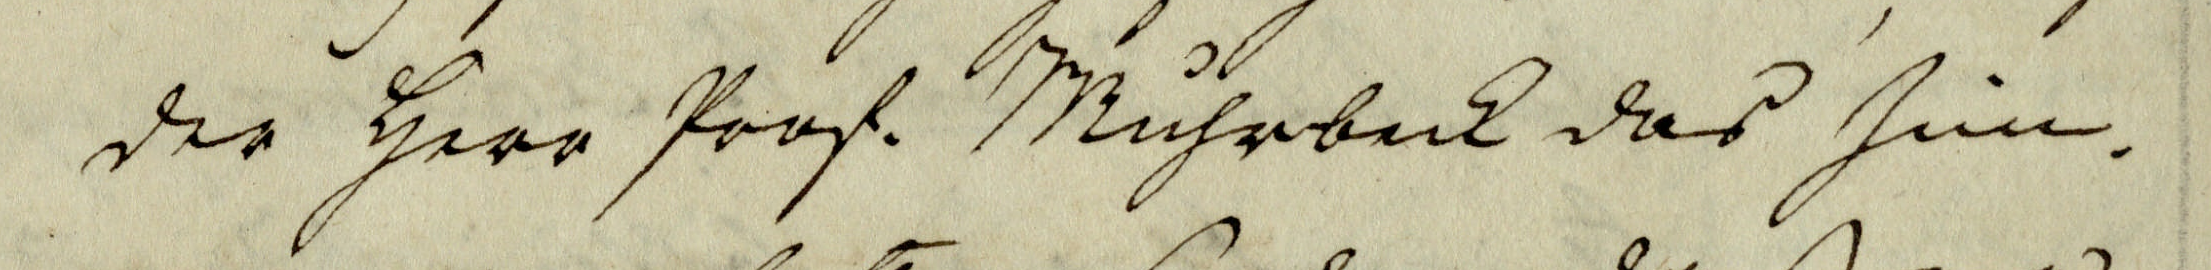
der Herr Prof. Muhrbeck das Zim¬
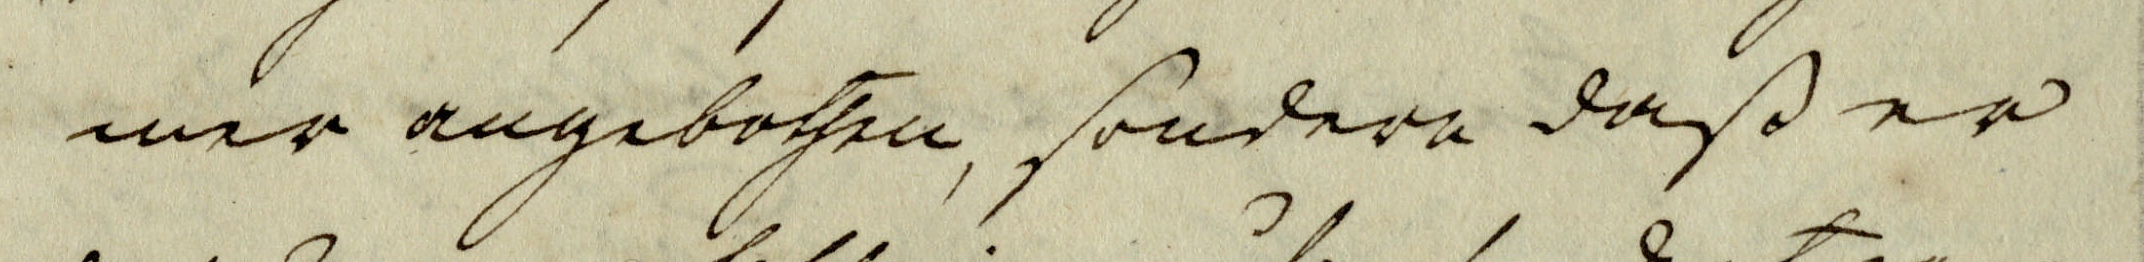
mer angebothen, sondern daß er
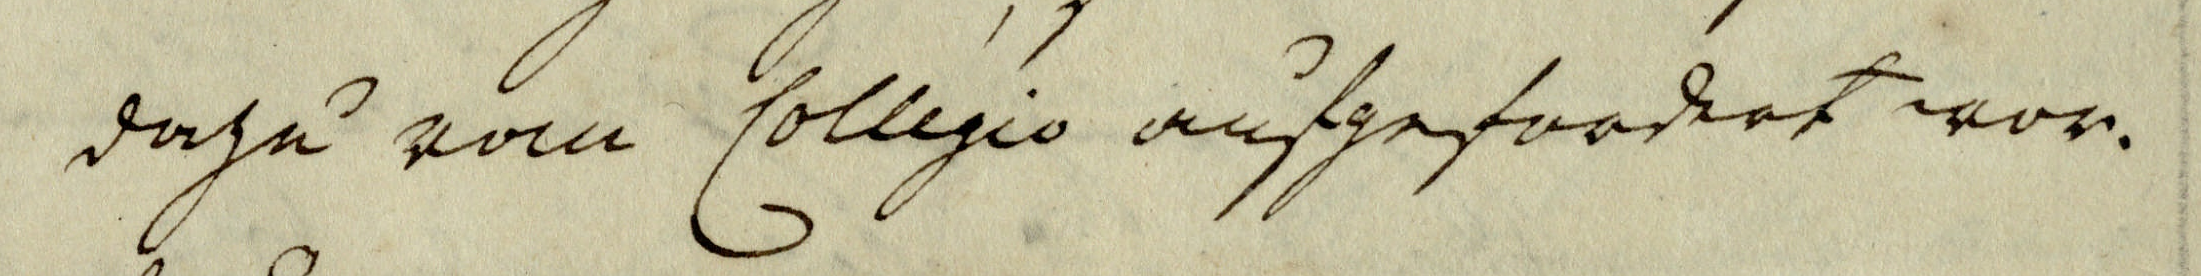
dazu vom Collegio aufgefordert wor¬
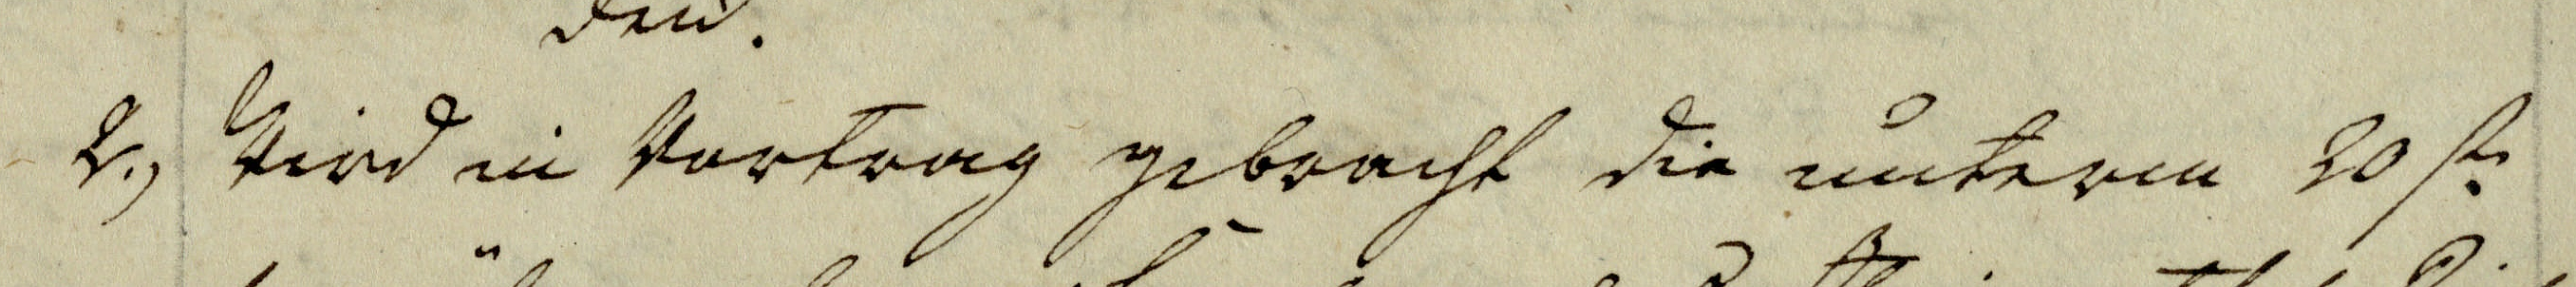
2., Wird in Vortrag gebracht die unterm 20 st
